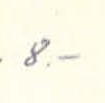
8.
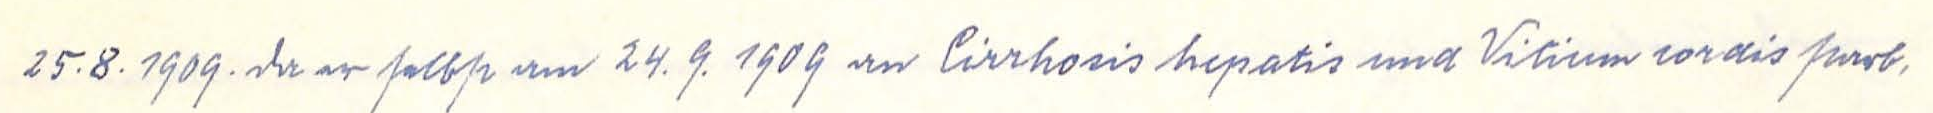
25.8.1909. Da er selbst am 24.9.1909 an Cirrhosis hepatis und Vitium cordis starb,
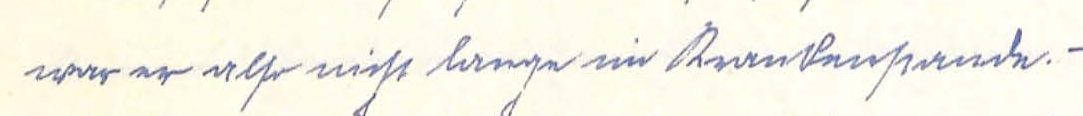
war er also nicht lange im Krankenstande.
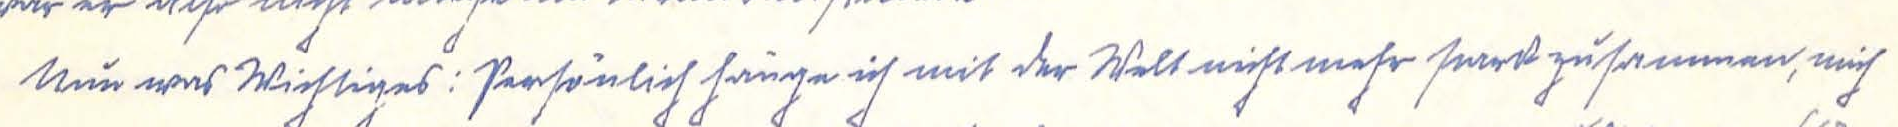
Nun was Wichtiges: Persönlich hänge ich mit der Welt nicht mehr stark zusammen, mich
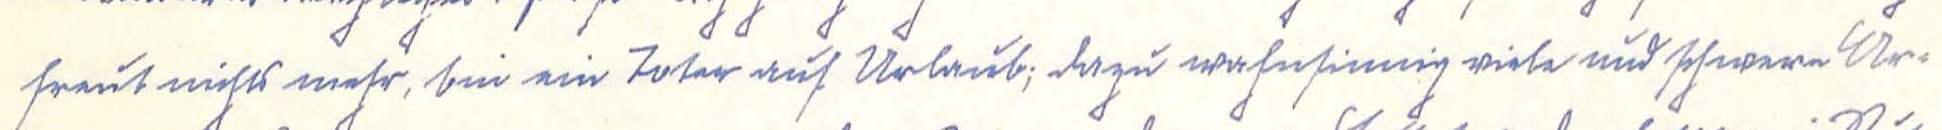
freut nichts mehr, bin ein Toter auf Urlaub; dazu wahnsinnig viele und schwere Ar-
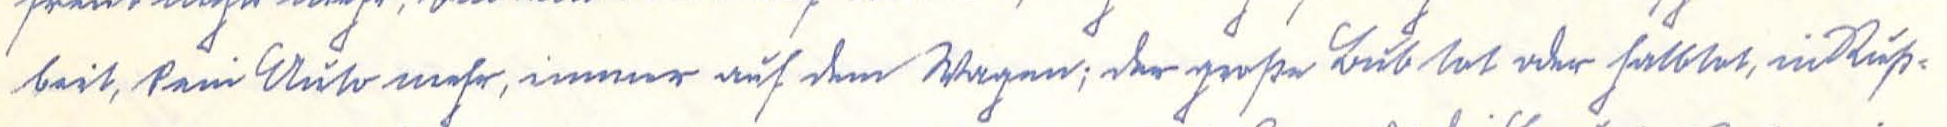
beit- kein Auto mehr, immer auf dem Wagen; der große Bub tot oder halbtot, in Ruß-
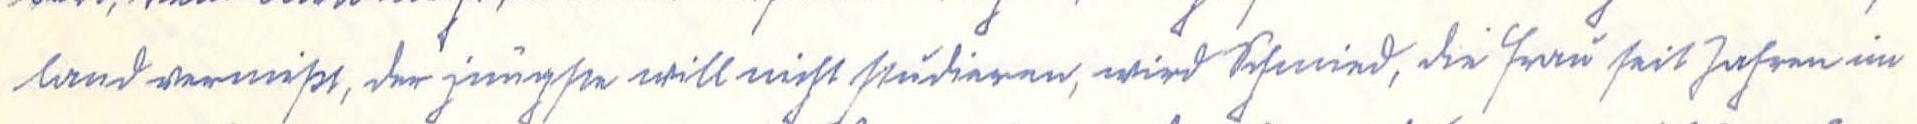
land vermißt, der jüngste will nicht studieren, wird Schmied, die Frau seit Jahren im
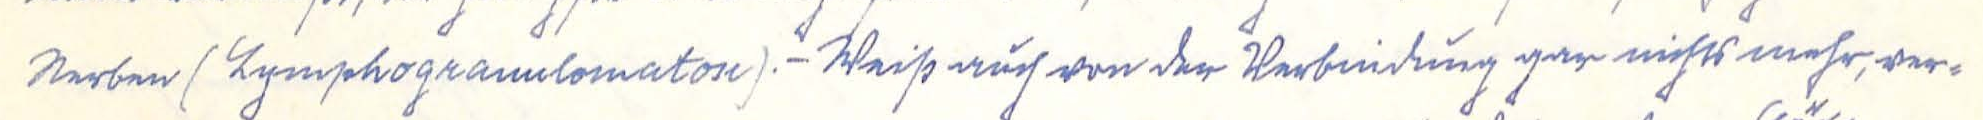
Sterben (Lymphogranulomatose).- Weiß auch von der Verbindung gar nichts mehr, ver-
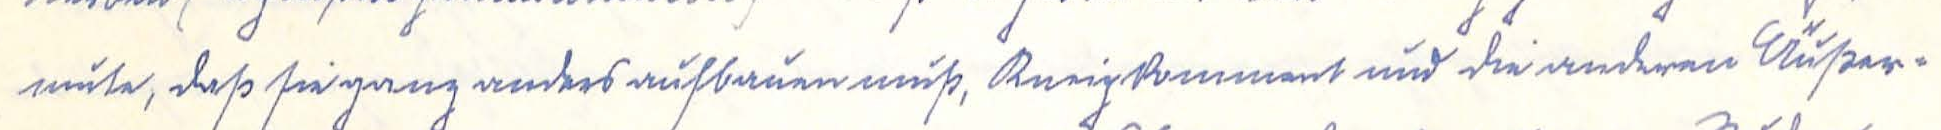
mute, daß sie ganz anders aufbauen muß, Kneipkomment und die anderen Äußer-
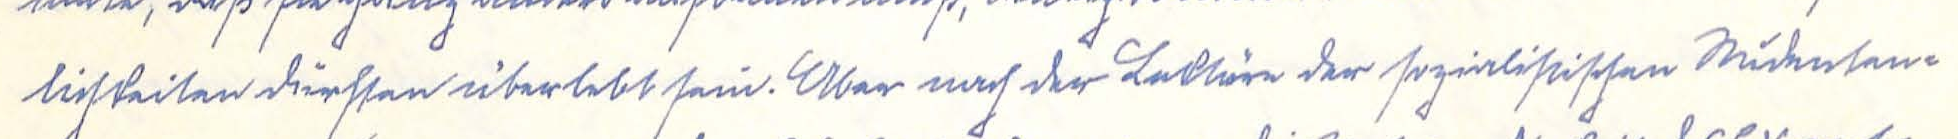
lichkeiten dürften überlebt sein. Aber nach der Lektion der sozialistischen Studenten-
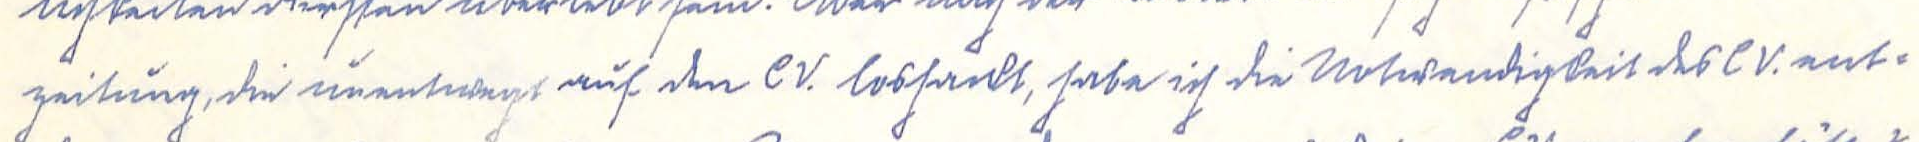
zeitung, die unentwegt auf den C.V. loshackt, habe ich die Notwendigkeit des C.V. ent-
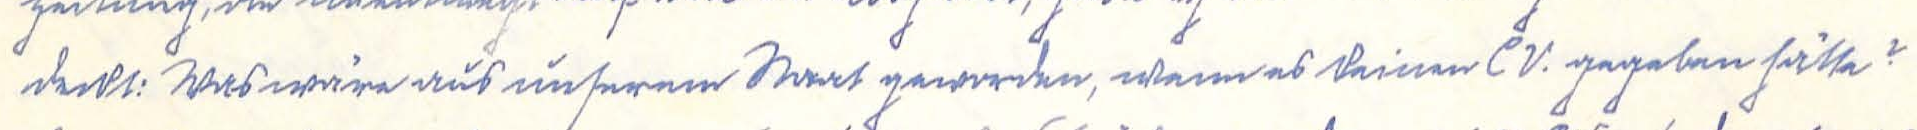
deckt: Was wäre aus unserem Staat geworden, wenn es keinen C.V. gegeben hätte?
